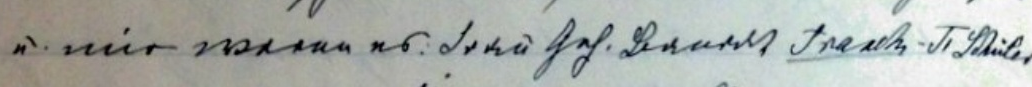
u. mir waren es: Frau Grf. Laurds, Fräulein. T. Schuler,
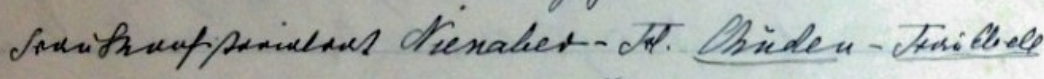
Frau Ministerialrat Nienaber – Frl. Auden – Frau Ebell
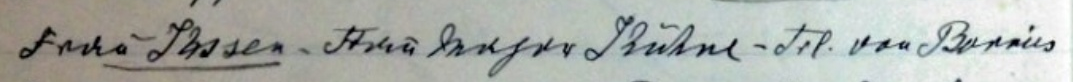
Frau Lassen – Frau Mayer Kühne – Frl von Boreis
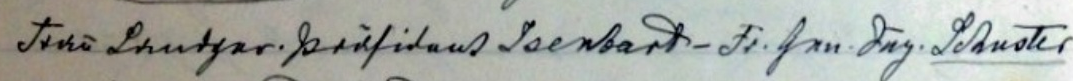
Frau Landgar. Präsident Isenbart – Fr. Gen. Sup. Schuster
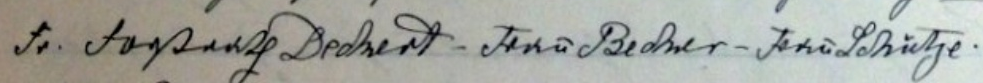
Fr. Forstrath Dechnert – Frau Bechner – Frau Schütze
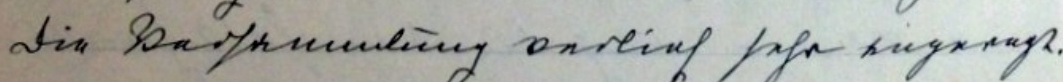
Die Versammlung verlief sehr angeregt.
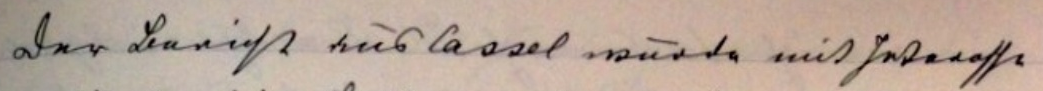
Der Bericht aus Cassel wurde mit Interesse
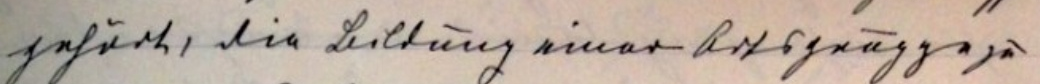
gehört, die Bildung einer Ortsgruppe zu
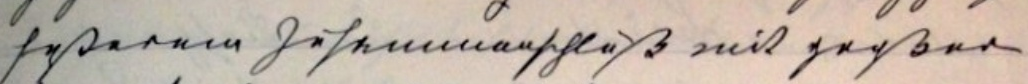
festeren Zusammenschluss mit großer
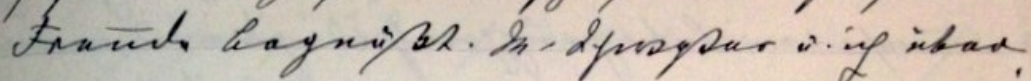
Freude begrüßt. M. Schwester u. ich über
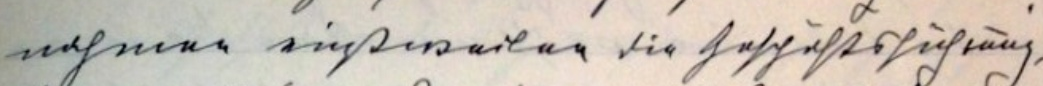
übernahmen einstweilen die Geschäftsführung,
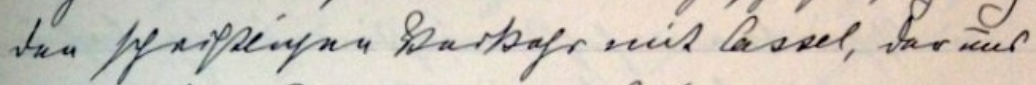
den schriftlichen Verkehr mit Cassel, der uns
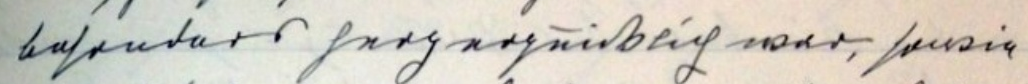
besonders herzerquicklich war, sowie
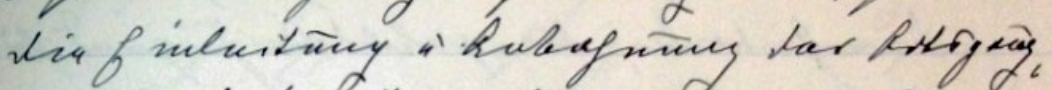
die Einleitung u. Anbahnung der Ortsgrup
